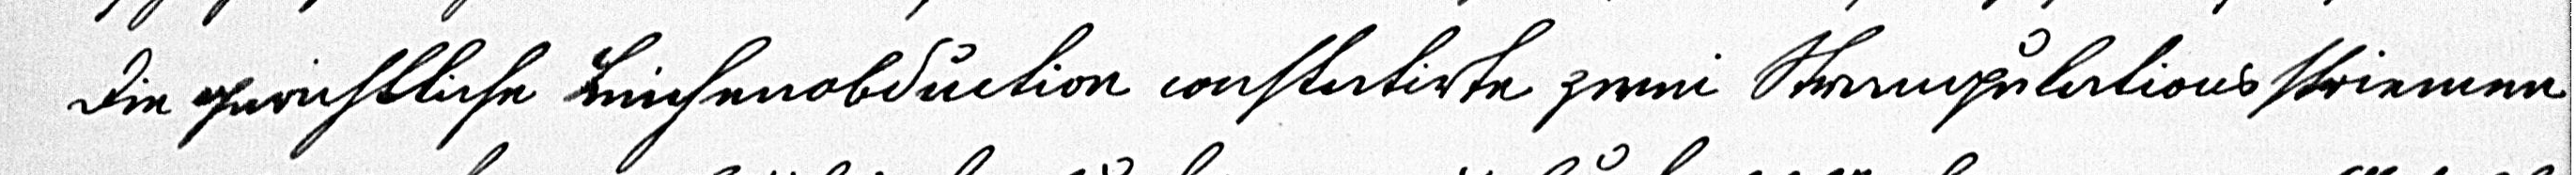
Die gerichtliche Leichenobduction constatirte zwei Strangulationsstriemen
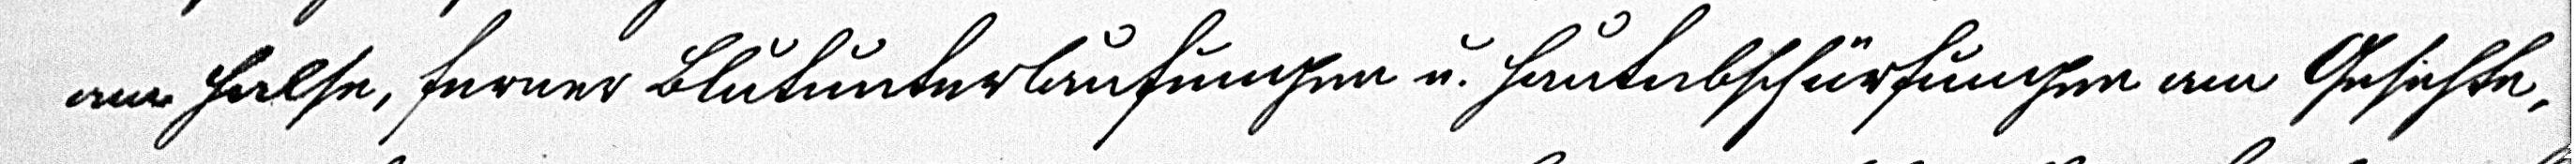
am Halse, ferner Blutunterlaufungen u. Hautabschürfungen am Gesichte,
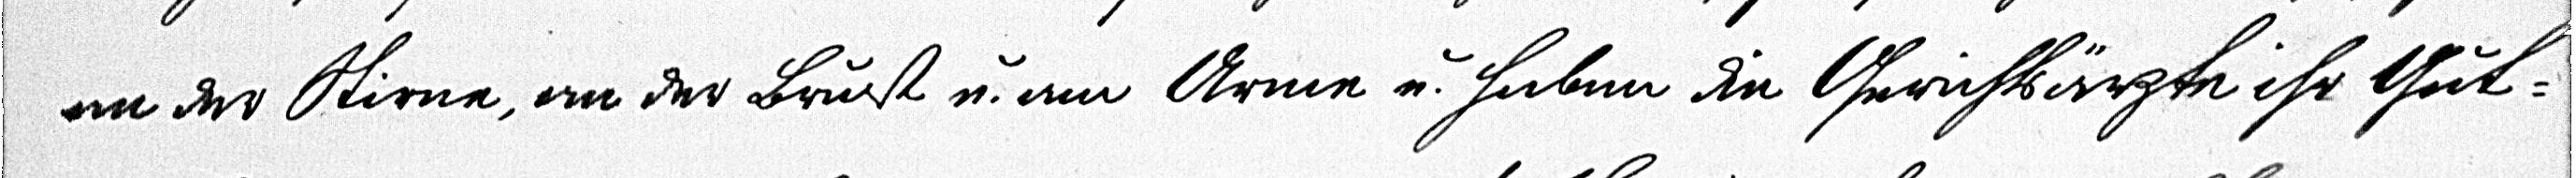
an der Stirne, an der Brust u. am Arme u. Haben die Gerichtsärzte ihr Gut¬
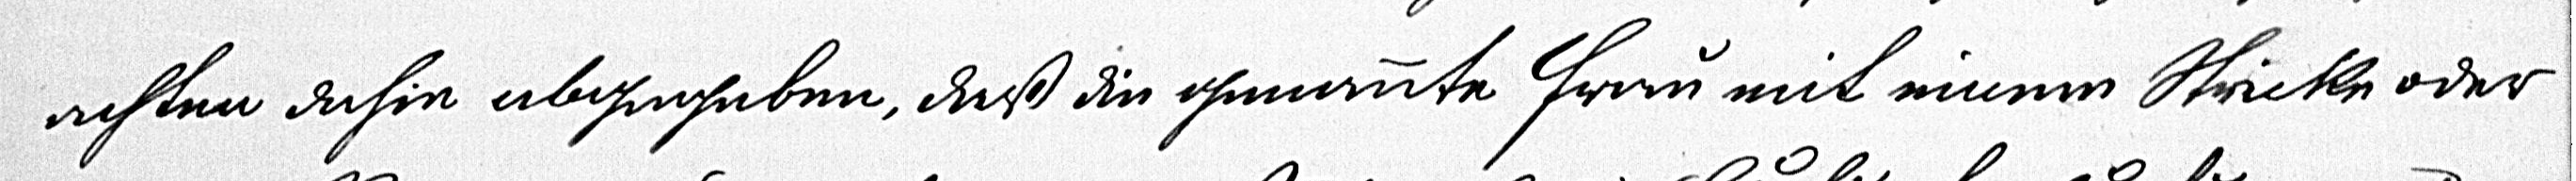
achten dahin abgegeben, daß die genannte Frau mit einem Stricke oder
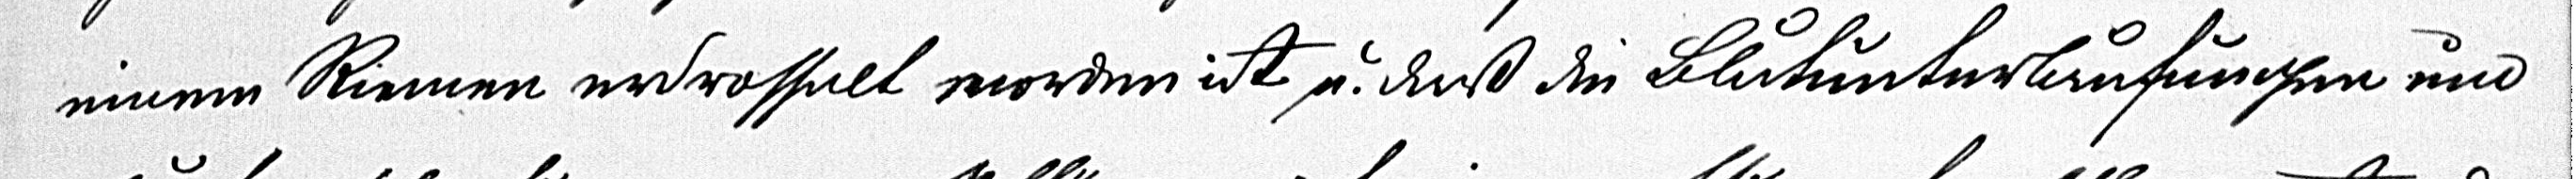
einem Riemen erdrossalt worden ist u. daß die Blutunterbrufungen und
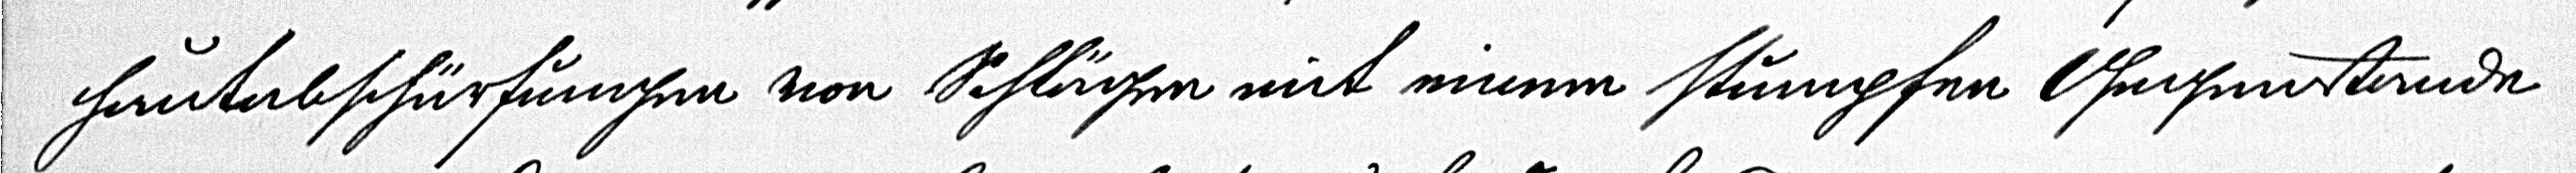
Hautabschürfungen von Schlägen mit einem stumpfen Gegenstande
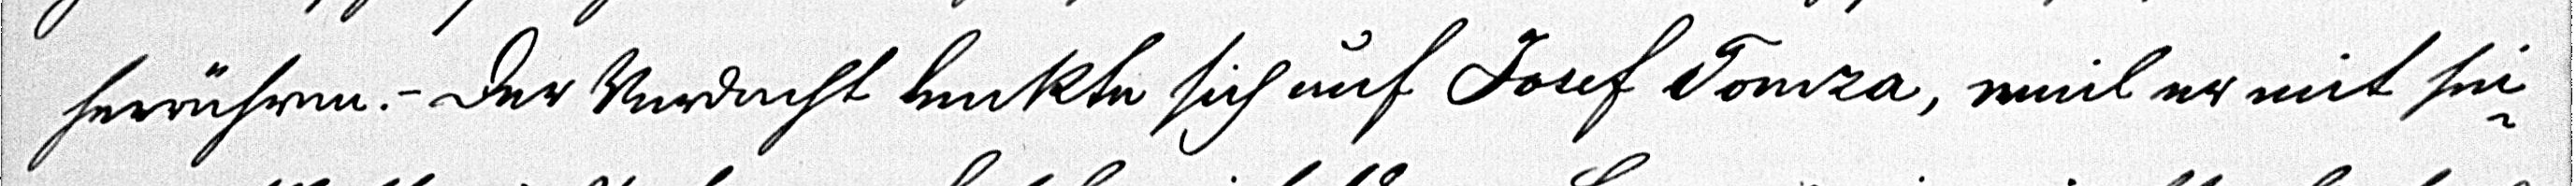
herrühren.- Der Verdacht lenkte sich auf Josef Tomza, weil er mit sei¬
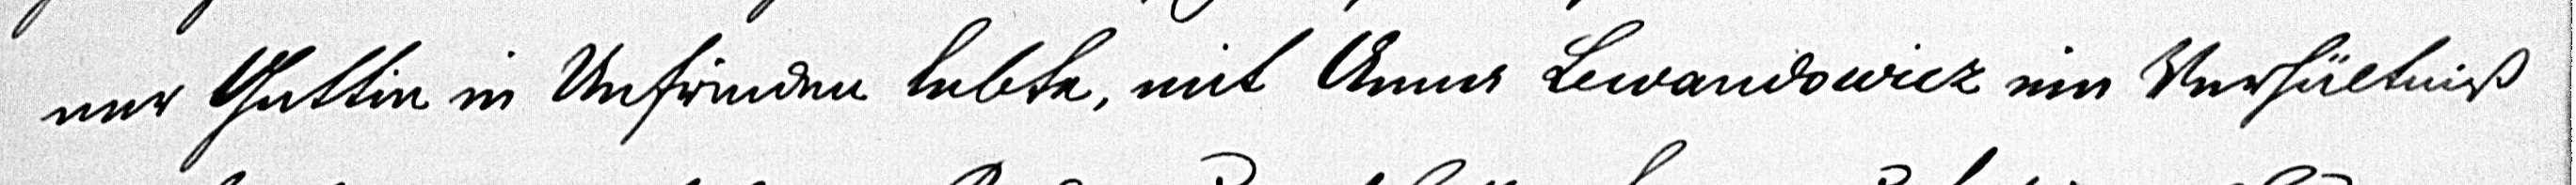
ner Gattin in Unfrieden lebte, mit Anna Lewandowicz ein Verhältniß
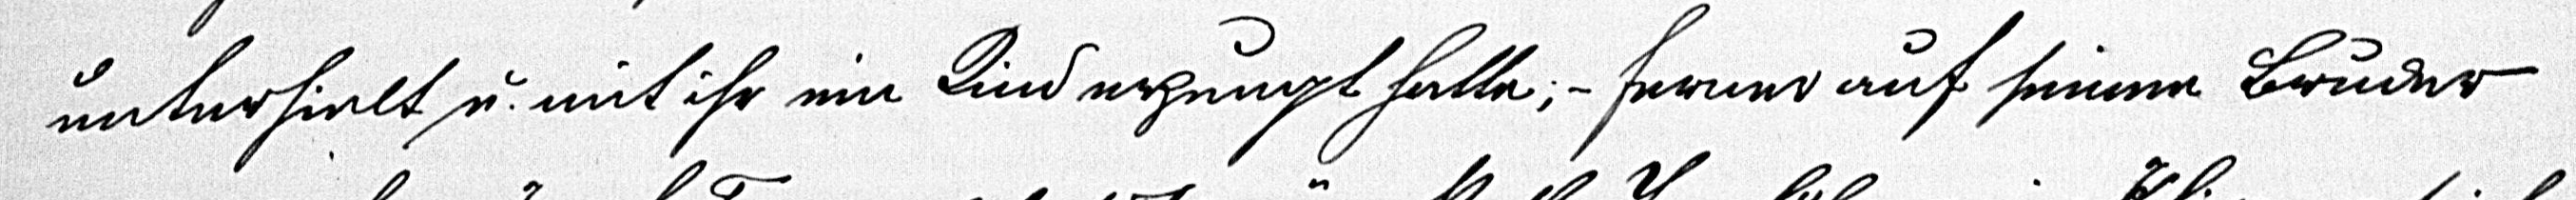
unterhielt u. mit ihr ein Kind erzeugt hatte;- ferner auf seinen Bruder
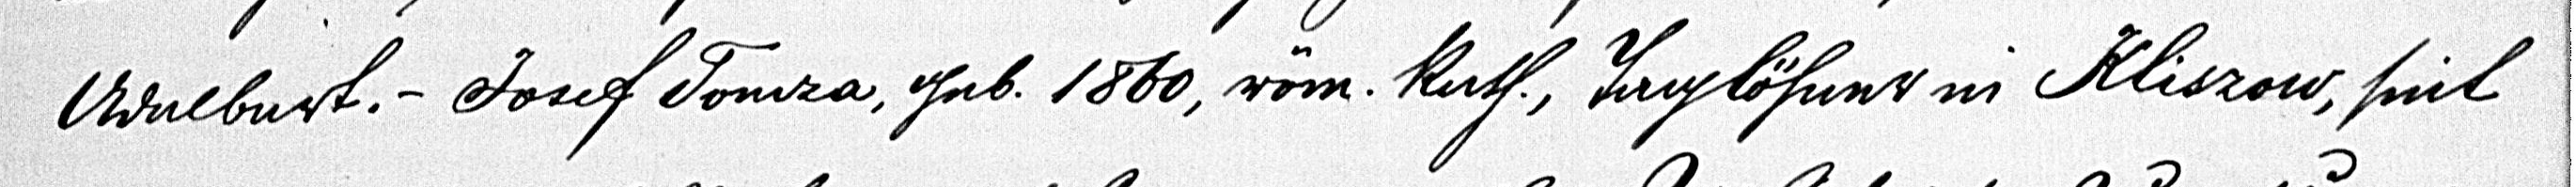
Adalbert.- Josef Tomza, geb. 1860, röm. kath., Taglöhner in Kliszow, seil
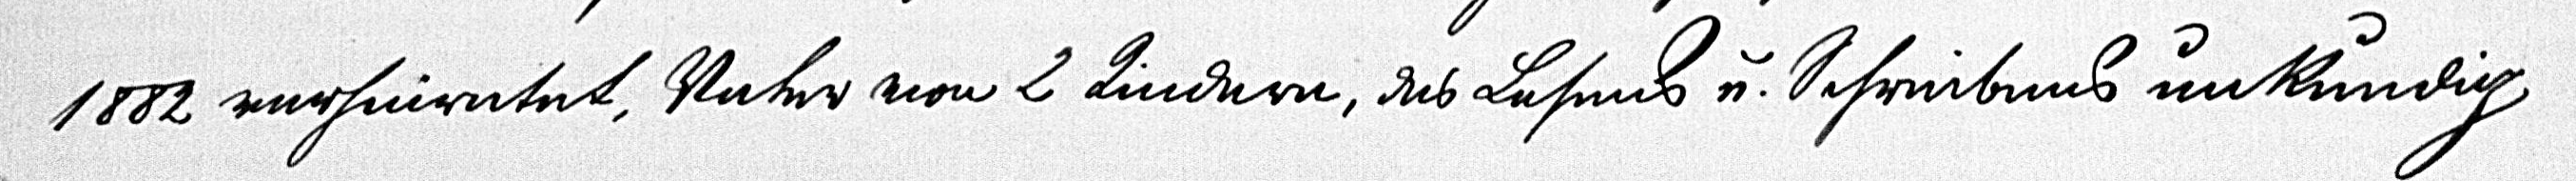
1882 verheiratet, Vater von 2 Kindern, des Lesens u. Schreibens unkundig
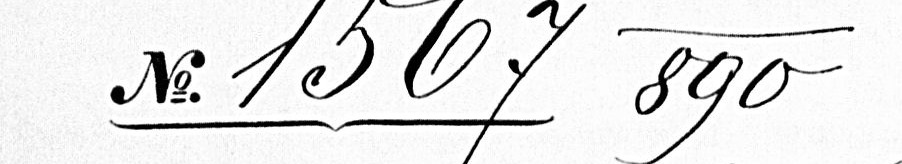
N° 1567 890
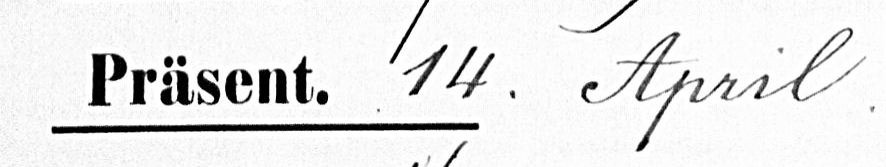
Präsent. 14. April.
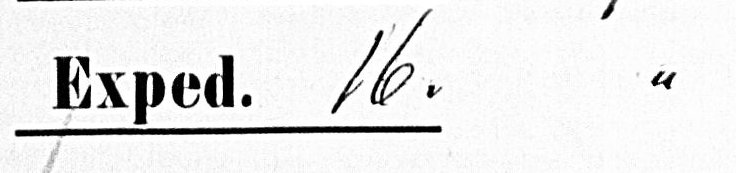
Exped. 16. April.
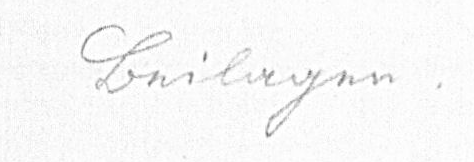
Beilagen.
